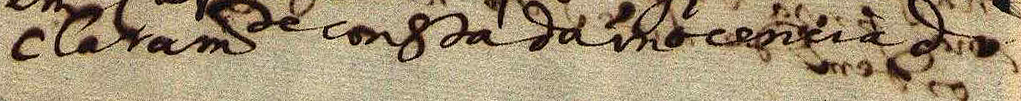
claramte consta da inocencia do
